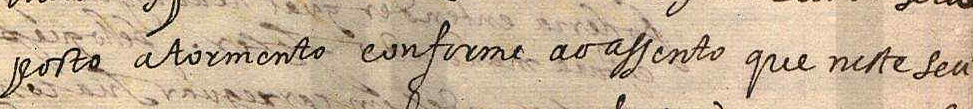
posto a tormento conforme ao assento que neste seu
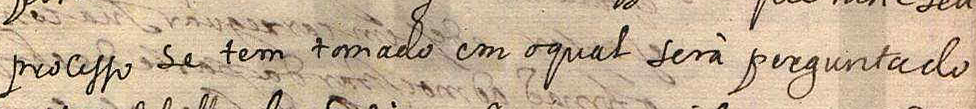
processo se tem tomado em o qual serà perguntado
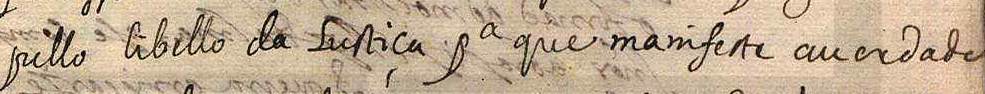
pello libello da Iustiça pa que manifeste a uerdade
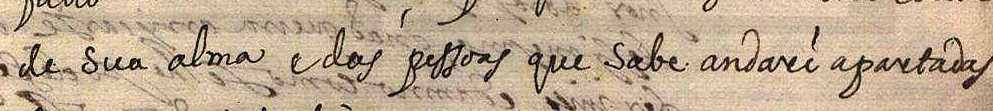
de sua alma e das pessoas que sabe andarē apartadas
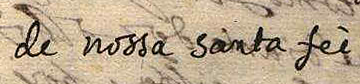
de nossa santa feè
